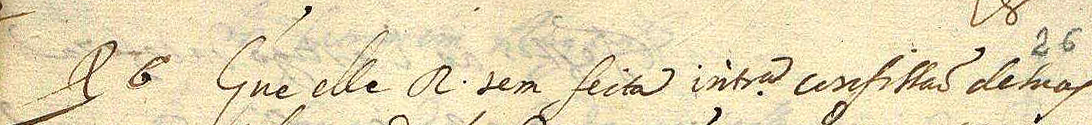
ꝓ 6 Que elle R. tem feita intr.a confissaõ de suas
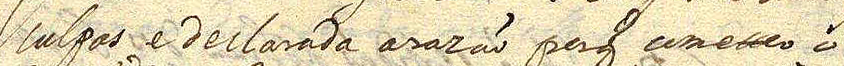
culpas e declarada a razaõ porq̄ cometteo o
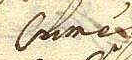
crime
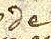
de
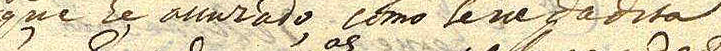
que he accuzado, como se uê da dita
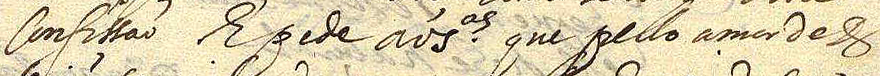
confissaõ E pede a v sas. que pello amor de Ds̄
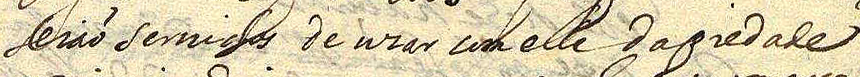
seiaõ seruidos de uzar com elle da piedade
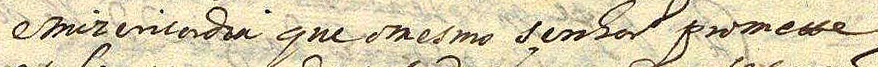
e mizericordia que o mesmo senhor promette
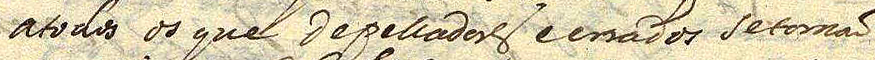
a todos os que de peccadores e criados se tornaõ
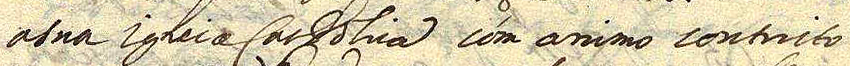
a sua igreia Catholica com animo contricto
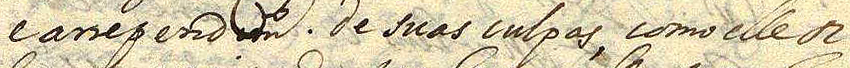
e arrependimto. de suas culpas, como elle R
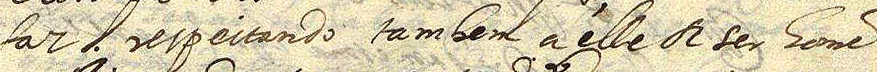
faz respeitando tambem a elle R ser homē
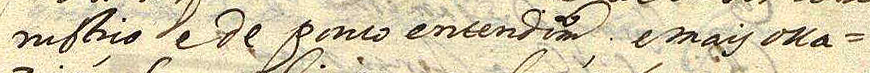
rustico, e de pouco entendimto, e mais occa
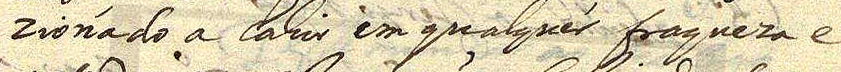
zionado a cahir em qualquer fraqueza e
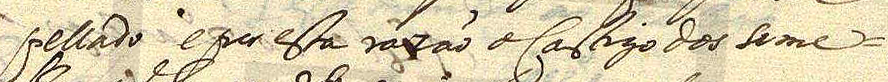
peccado, e por esta razaõ o Castigo dos seme
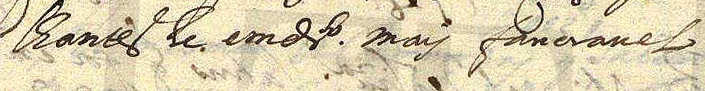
lhantes he em drto. mais fauoraueL
